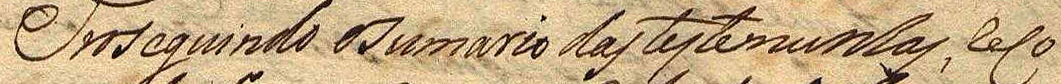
Proseguindo o sumario das testemunhas, ReCo
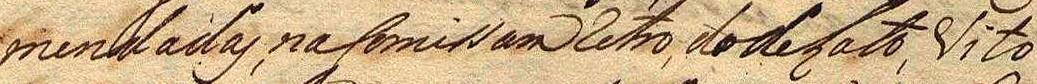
mendadas, na Comissam Retro, do deLato, Vito
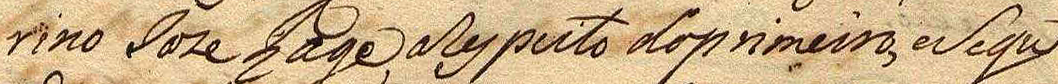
rino Ioze Lage, a Respeito dos primeiro, e Segu
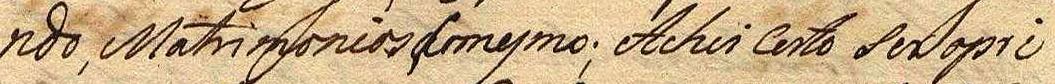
ndo, Matrimonios do mesmo; Achei certo ser o pri
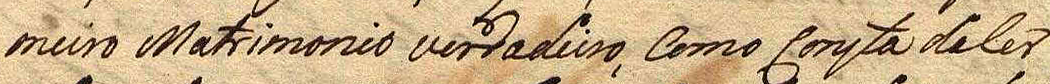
meiro Matrimonio verdadeiro, como Consta de Cer
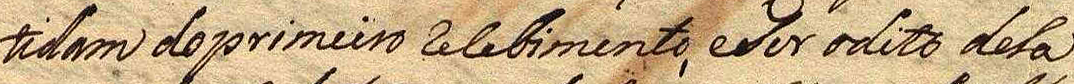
tidam do primeiro ReCebimento, e Ser o dito dela
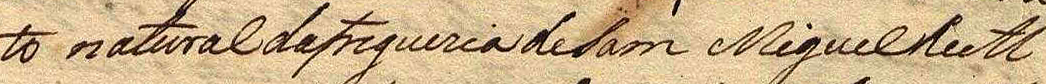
to natural da freguezia de Sam Miguel de Al
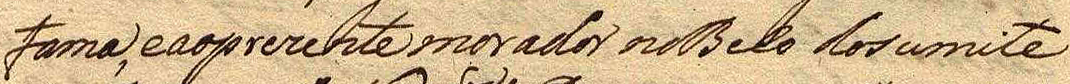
fama, e ao prezente morador no Beco do sumite
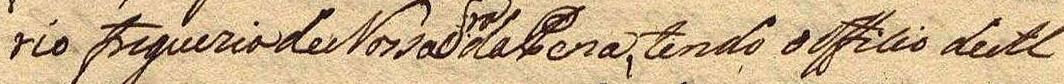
rio freguezia de Nossa S.ra da Pena, tendo officio de Al
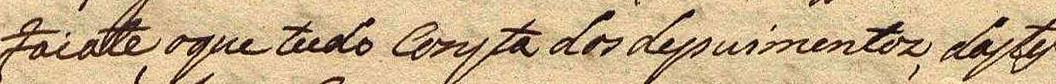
faiate, o que tudo consta dos depuimentos, das tes
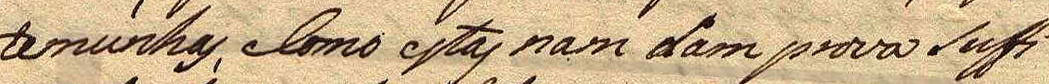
temunhas, e Como estas nam sam prova suffi
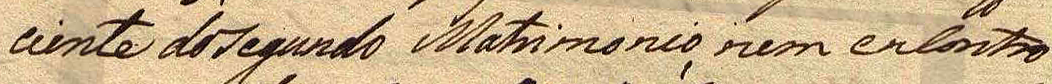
ciente do segundo Matrimonio, nem encontro
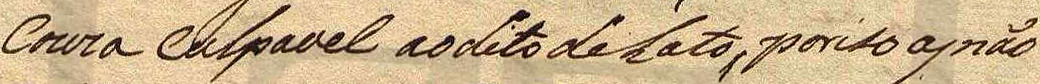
couza culpavel ao dito deLato, poriso as não
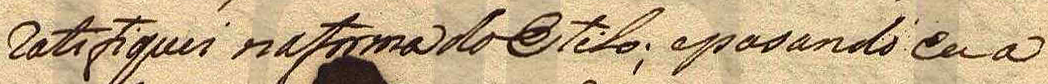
Ratifiquei na forma do Estilo; e pasando Eu a
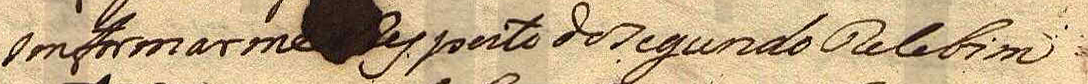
Imformarme_Respeito do segundo ReCebim
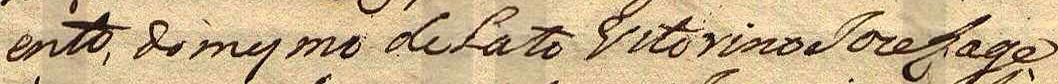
ento, do mesmo deLato Vitorino Ioze Lage,
